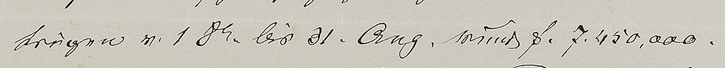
trugen v. 18ten bis 31. Aug. rund Fs. 7.450,000.
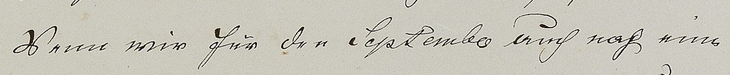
Wenn wir für den September auch noch eine
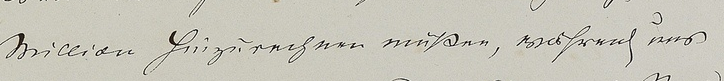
Million hinzurechnen müßen, während uns
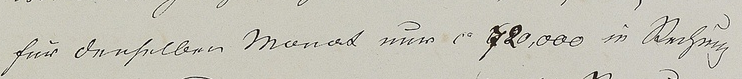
für denselben Monat nur ca 720,000 in Rechnung
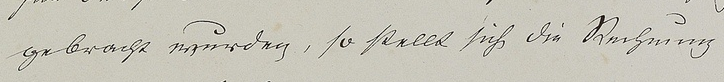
gebracht wurden, so stellt sich die Rechnung
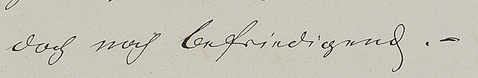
doch noch befriedigend. –
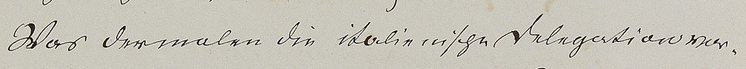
Was dermalen die italienische Delegation vor-
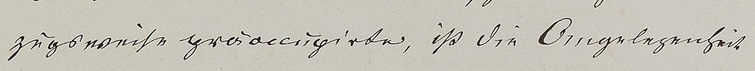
zugsweise präoccupirte, ist die Angelegenheit
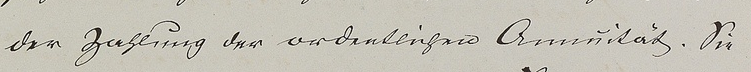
der Zahlung der ordentlichen Annuität. Sie
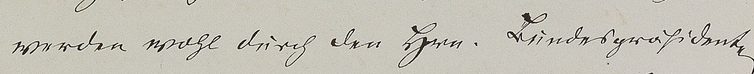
werden wohl durch den Hrn. Bundespräsidenten
